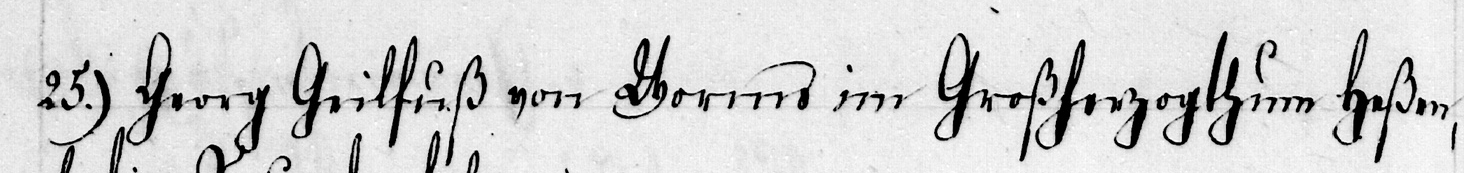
25.) Georg Geilfuß von Worms im Großherzogthum Heßen,
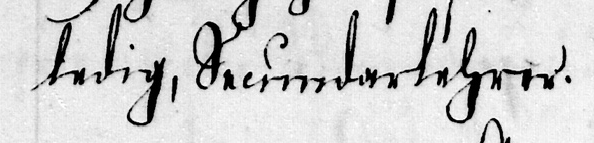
ledig, Secundarlehrer.
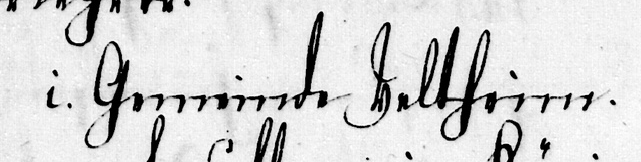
i. Gemeinde Veltheim.
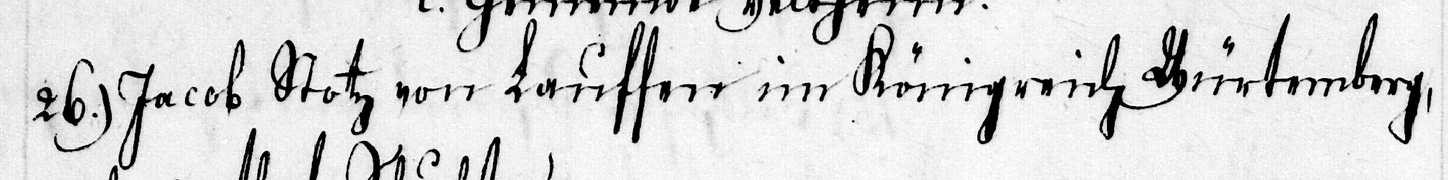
26.) Jacob Stotz von Lauffen im Königreich Würtemberg,
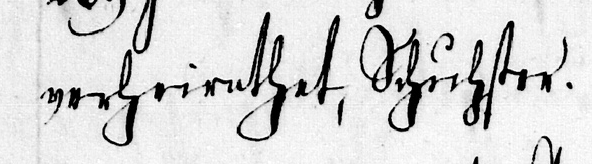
verheirathet, Schuhster.
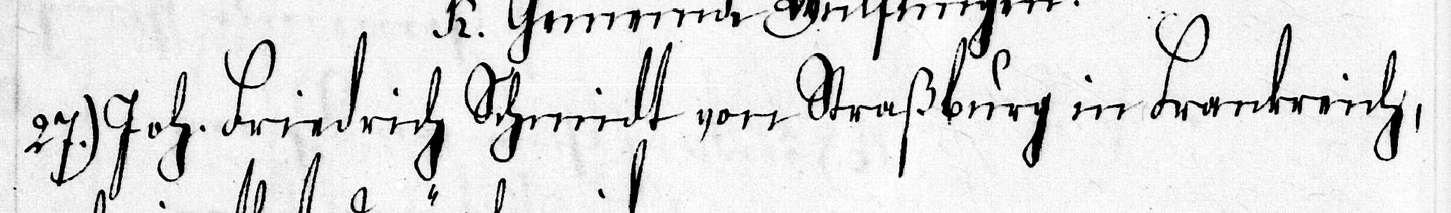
27.) Joh. Friedrich Schmidt von Straßburg in Frankreich,
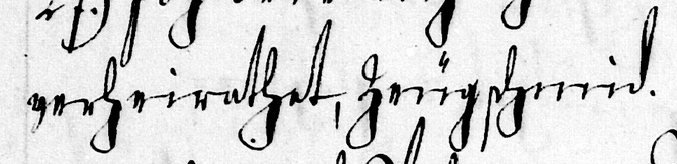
verheirathet, Zeugschmid.
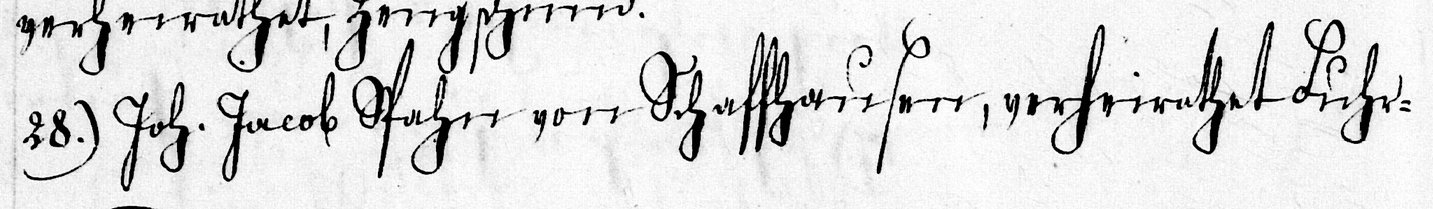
28.) Joh. Jacob Spahn von Schaffhausen, verheirathet Fuhr¬
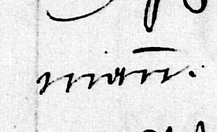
mann.
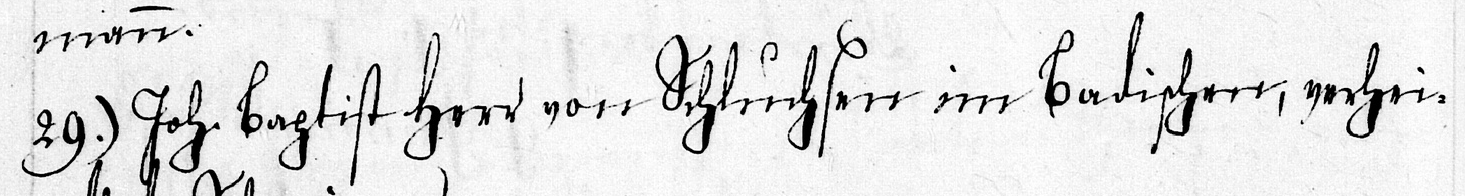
29.) Joh. Baptist Herr von Schluchsen im Badischen, verhei¬
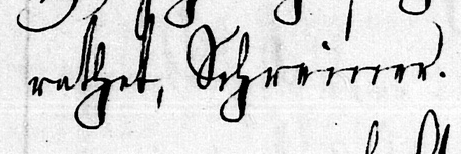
rathet, Schreiner.
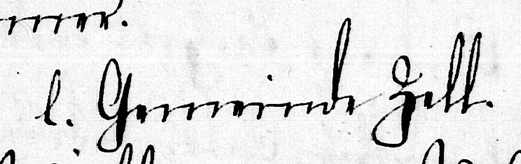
l. Gemeinde Zell.
